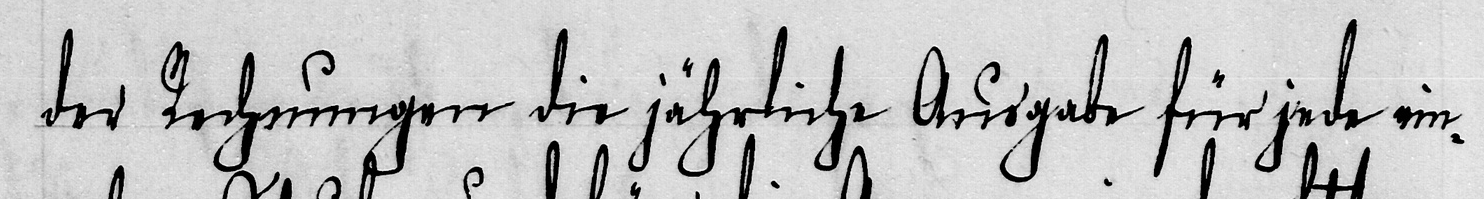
der Rechnungen die jährliche Ausgabe für jede ein¬
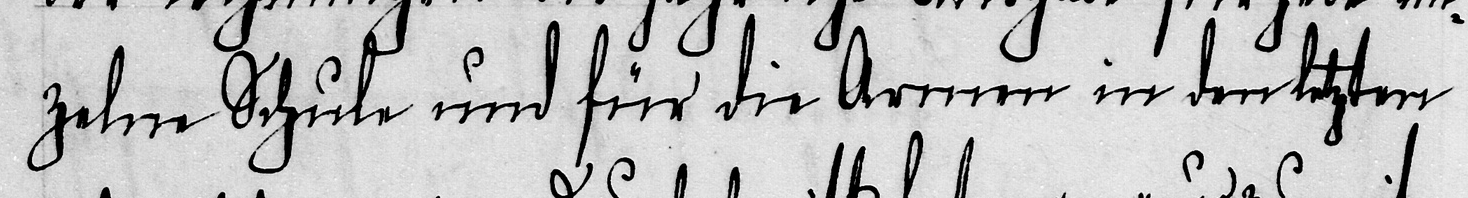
zelne Schule und für die Armen in den letzten
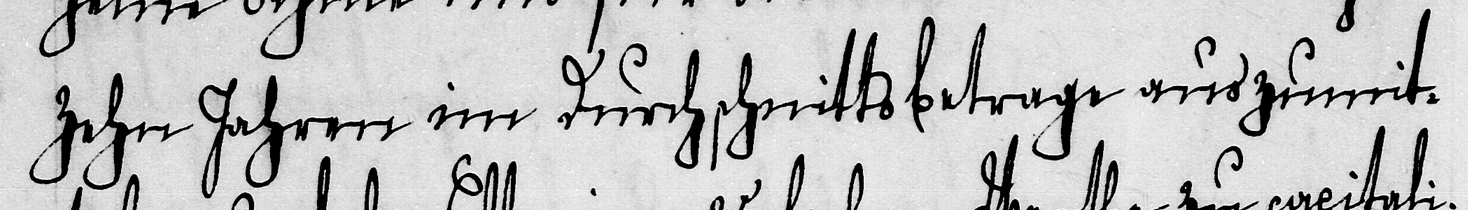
zehn Jahren im Durchschnittsbetrage auszumit¬
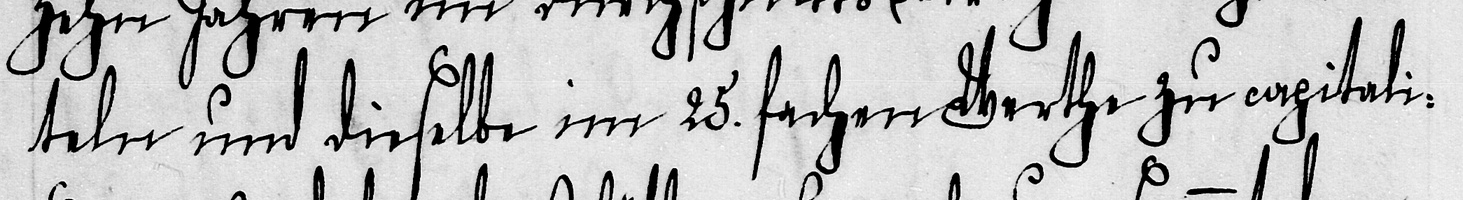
teln und dieselbe im 25. fachen Werthe zu capitali¬
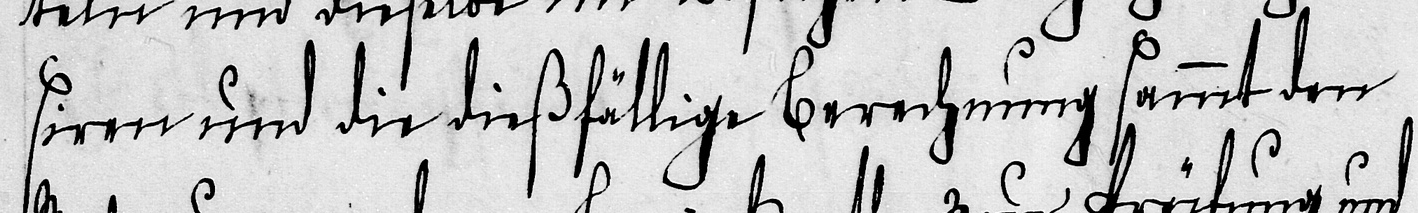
siren und die dießfällige Berechnung sammt den
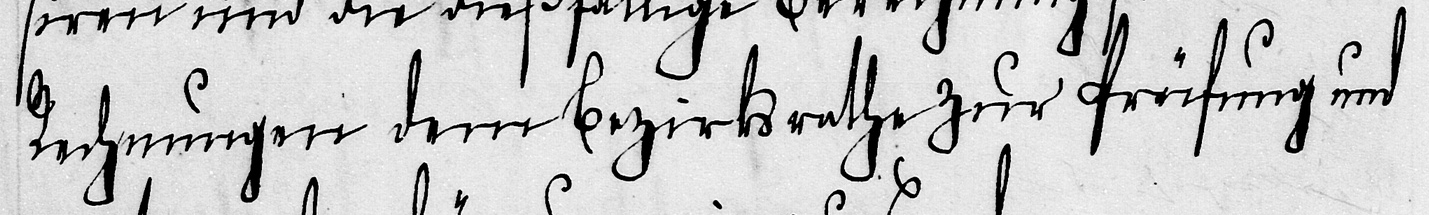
Rechnungen dem Bezirksrathe zur Prüfung und
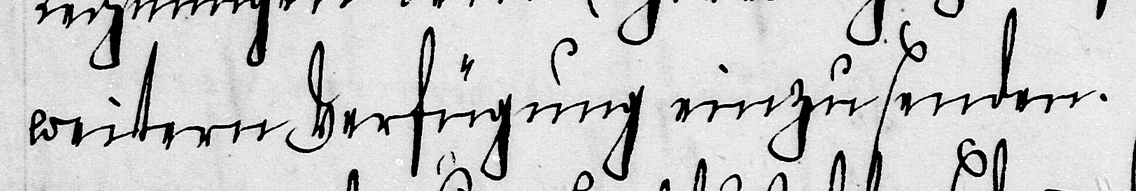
weitern Verfügung einzusenden.
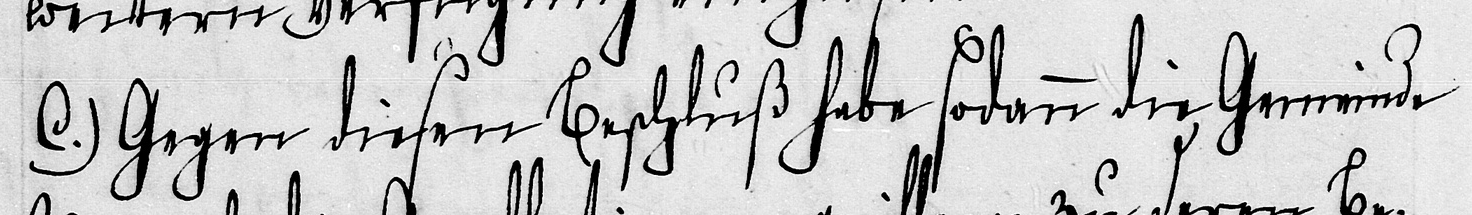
C.) Gegen diesen Beschluß habe sodann die Gemeinde
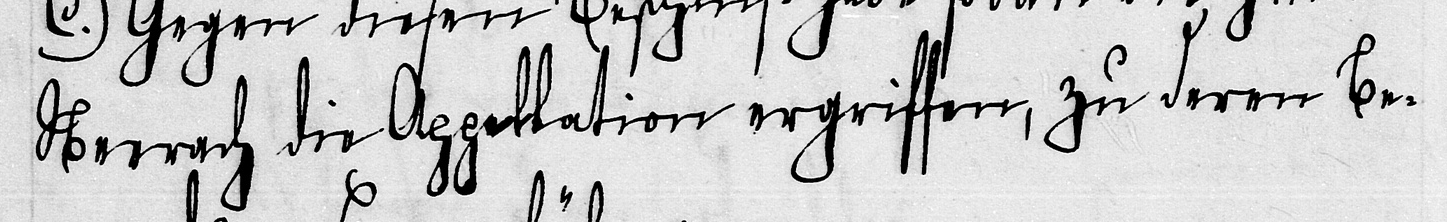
Neerach die Appellation ergriffen, zu deren Be¬
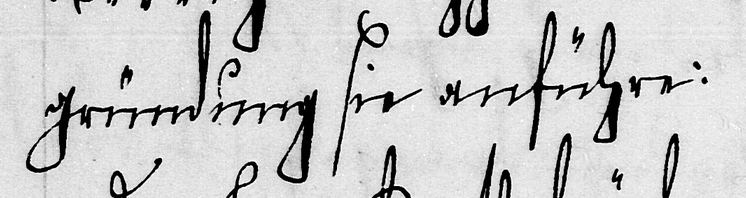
gründung sie anführe:
